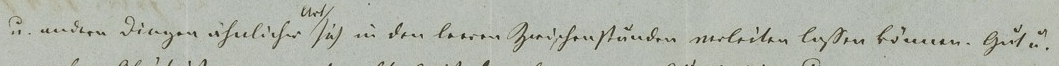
u. andern Dingen ähnlicher Art sich in den leeren Zwischenstunden verleiten lassen können. Gut u.
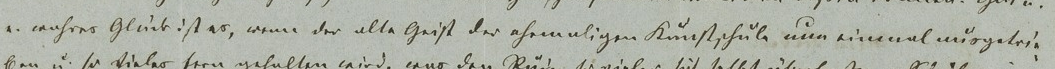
e. wahres Glück ist es, wenn der alte Geist der ehemaligen Kunstschule nun einmal ausgetrie-
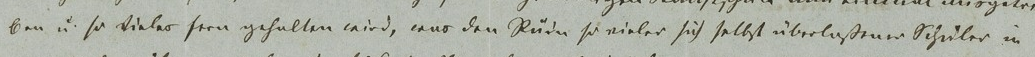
ben u. so Vieles fern gehalten wird, was den Ruin so vieler sich selbst überlaßener Schüler in
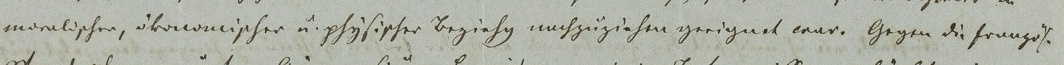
moralischer, ökonomischer u. physischer Beziehg nachzuziehen geeignet war. Gegen die französ.
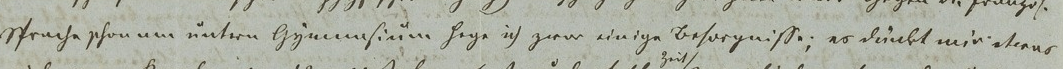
Sprache schon am untern Gymnasium hege ich zwar einige Besorgnisse; es dünkt mir etwas
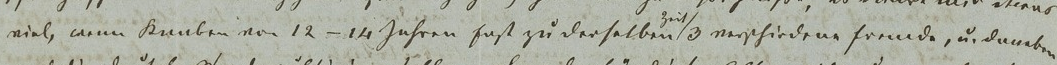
viel, wenn Knaben von 12–14 Jahren fast zu derselben Zeit 3 verschiedene fremde, u. daneben
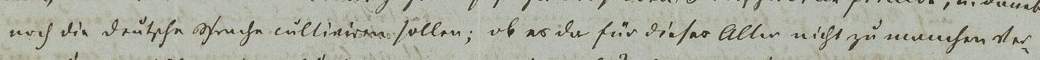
noch die deutsche Sprache cultiviren sollen; ob es da für dieses Alter nicht zu manchen Ver-
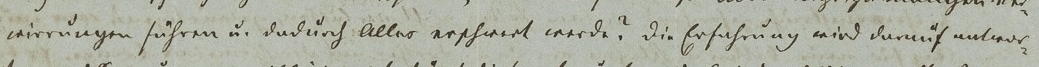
wirrungen führen u. dadurch Alles erschwert werde? Die Erfahrung wird darauf antwor-
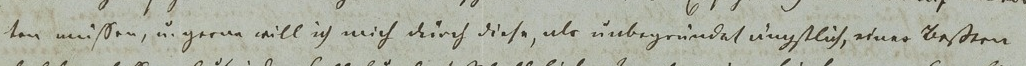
ten müssen, u. gerne will ich mich durch diese, als unbegründet ängstlich, eines Beßern
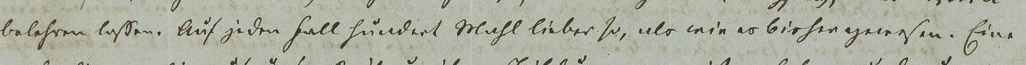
belehren lassen. Auf jeden Fall hundert Mahl lieber so, als wie es bisher gewesen. Eine
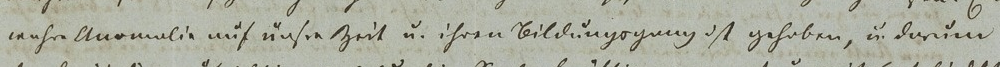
wahre Anomalie auf unsre Zeit u. ihren Bildungsgang ist gehoben, u. darum
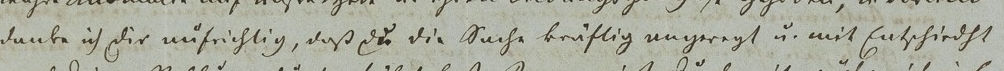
danke ich Dir aufrichtig, daß Du die Sache kräftig angeregt u. mit Entschiedht
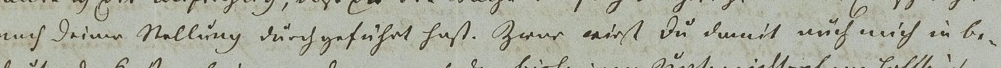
nach Deiner Stellung durchgeführt hast. Zwar wirst Du damit auch mich in be-
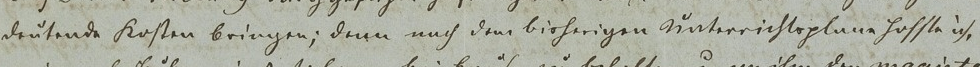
deutende Kosten bringen; denn nach dem bisherigen Unterrichtsplane hoffte ich,
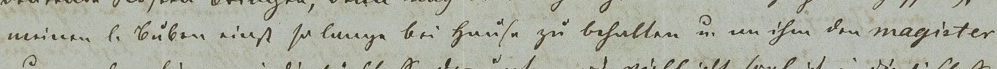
meinen l. Buben einst so lange bei Hause zu behalten u. an ihm den magister
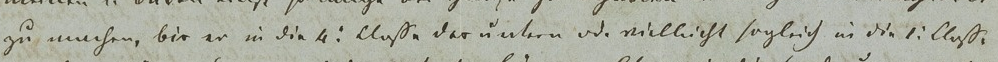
zu machen, bis er in die 4te Classe des untern od. vielleicht sogleich in die 1te Classe
